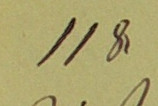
118
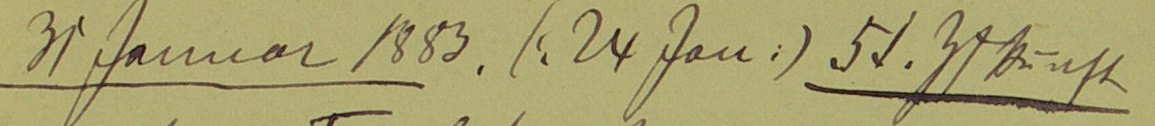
31. Januar 1883. (: 24 Jan. ) 51. Zskunft
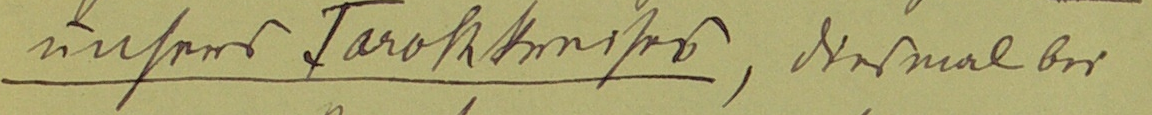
unseres Tarokkreises, diesmal bei
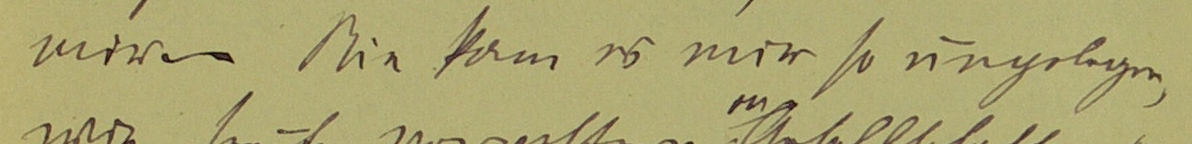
mir. - Mir kam es nur so ungelegen,
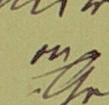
in
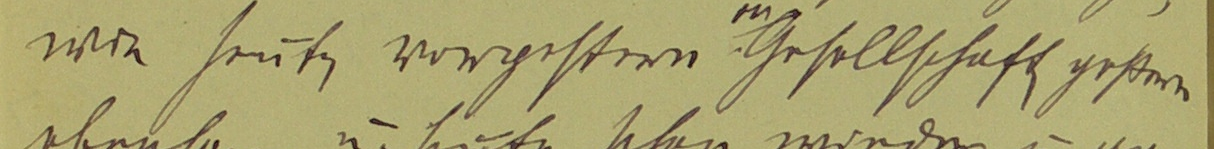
war seit vorgestern Gesellschaft gestern
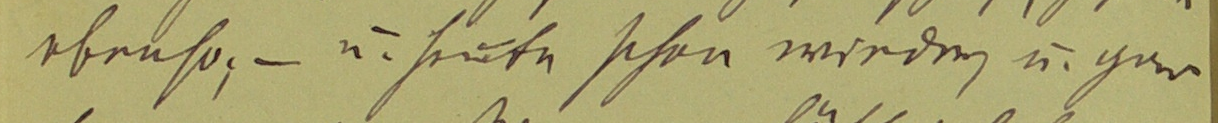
ebens,. - u. heute schon wieder, und gar
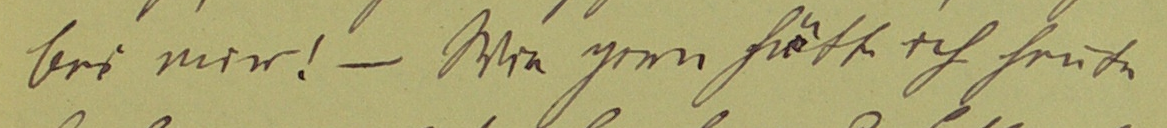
bei mir! - Wie gern hätte ich heute
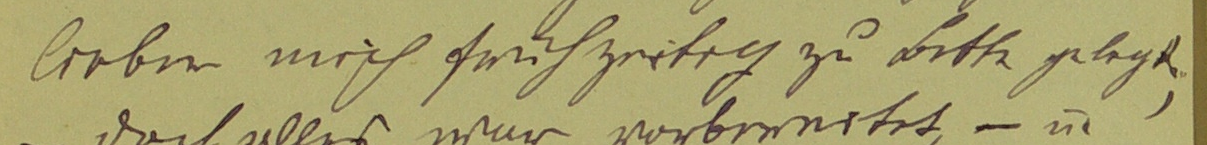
lieber mich frühzeitig zu Bette gelegt,
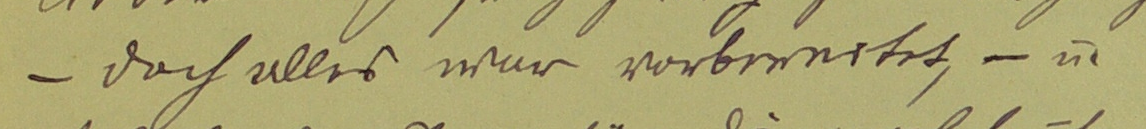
- doch alles war vorbereitet, - u.
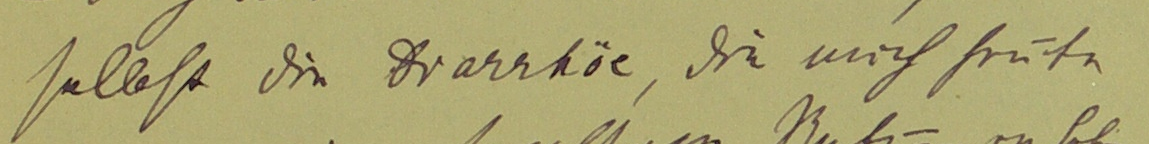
selbst die Diarrhöe, die mich heute
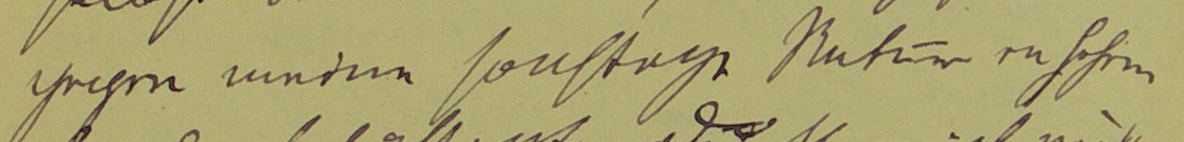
gegen meine sonstige Natur in hohem
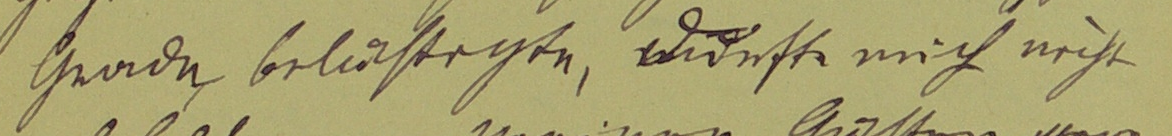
Grade belästigte, durfte mich nicht
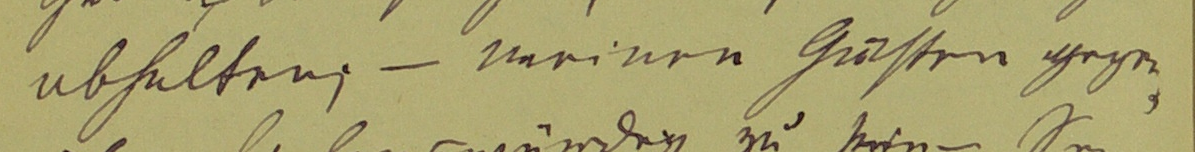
abhalten; - meinen Gästen gegen¬
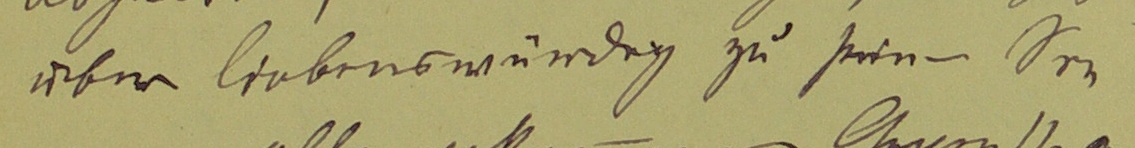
über liebenswürdig zu sein. - Sie
